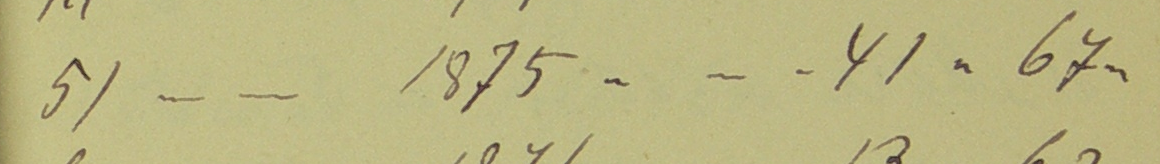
5.) * 1875 * = 41 * 67 *
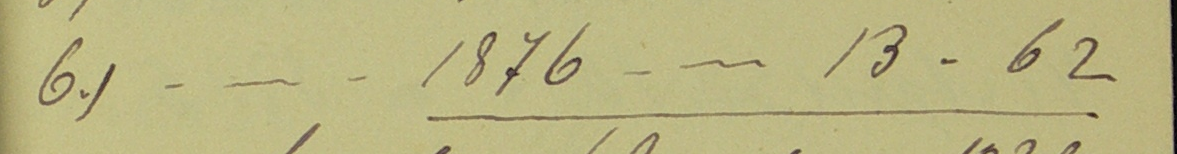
6) * 1876 * = 13 * 62 *
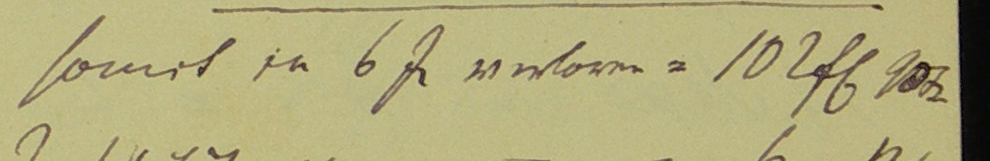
Somit in 6 Jahren verloren = 102 * 90 *
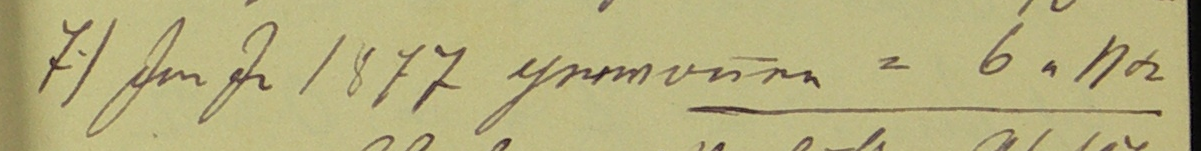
7.) Im J. 1877 gewonnen = 6 Fl 11 Tr
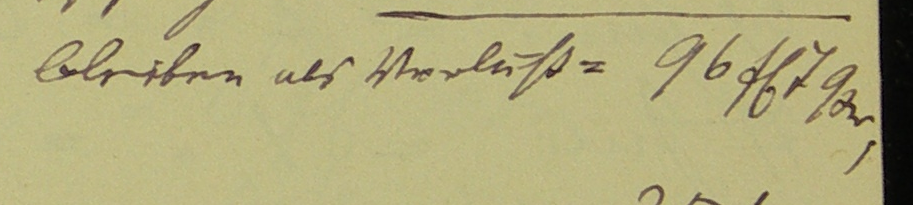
Bleiben als Verlust = 96 * 79 *
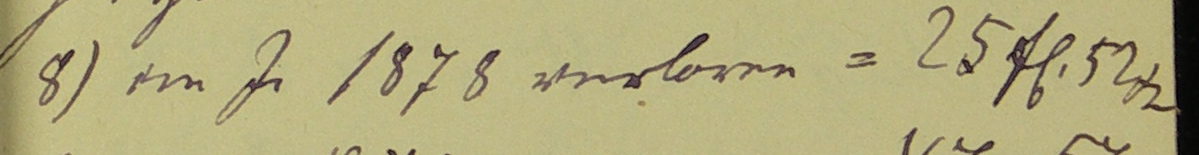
8) + 1878 verloren = 15 Fl 52 Tr
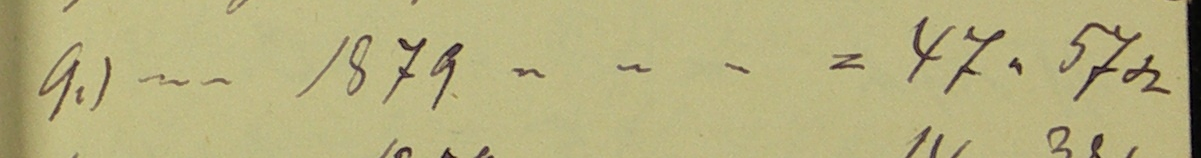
9.) * 1879 * = 47 * 57 *
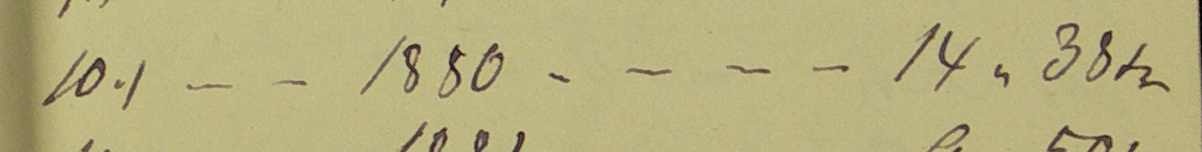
10.) * 1880 * = 14 * 38 *
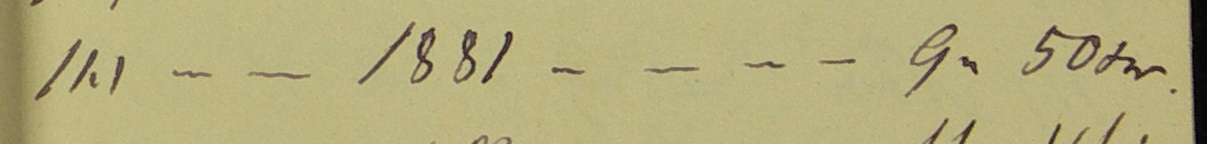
11.) * 1881 * = 9 * 50 *
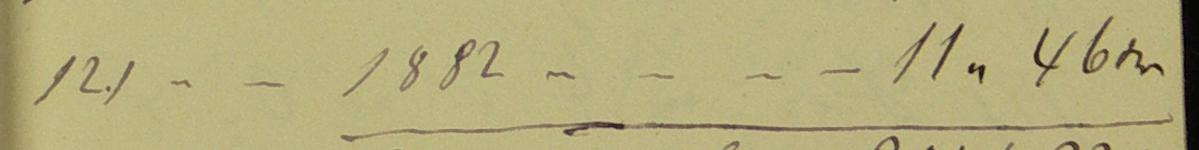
12.) 1882 * = 11 * 46 *
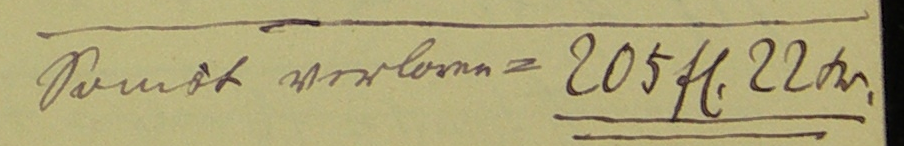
Somit verloren = 205 fl 22 din
